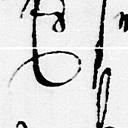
t¬
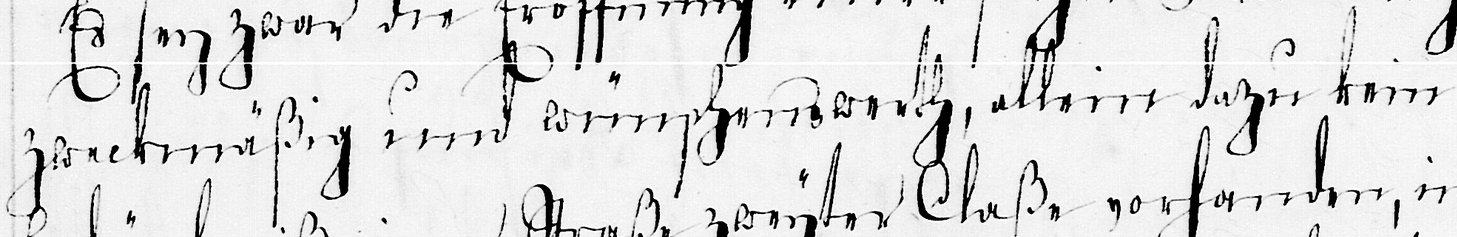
zweckmäßig und wünschenswerth, allein dazu kein
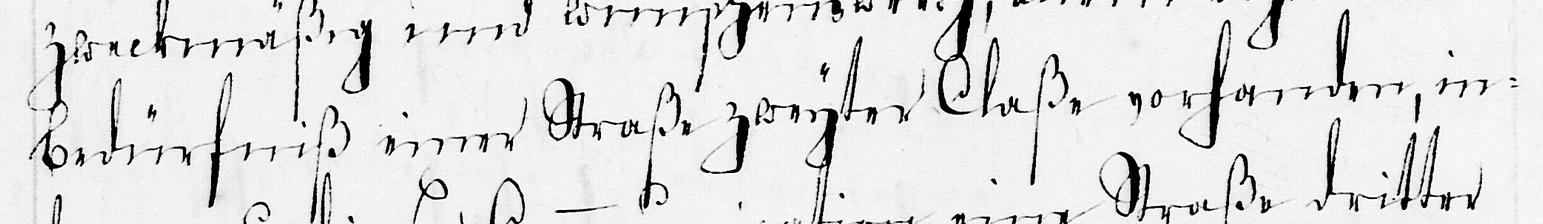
Bedürfniß einer Straße zweyter Claße vorhanden, in¬
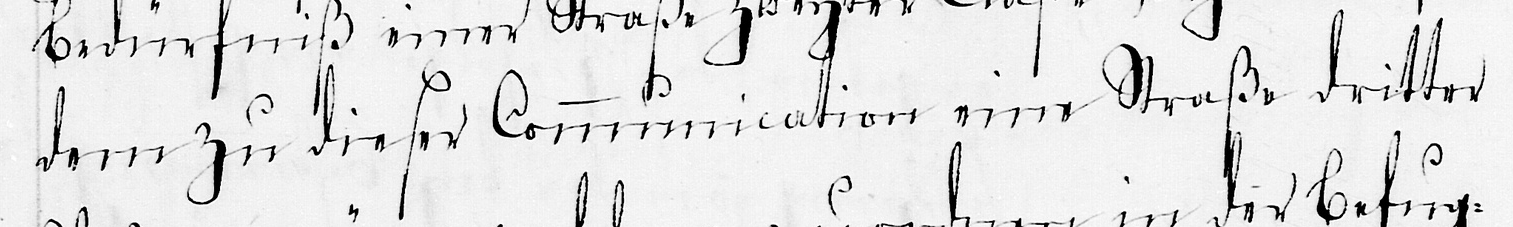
dem zu dieser Communication eine Straße dritter
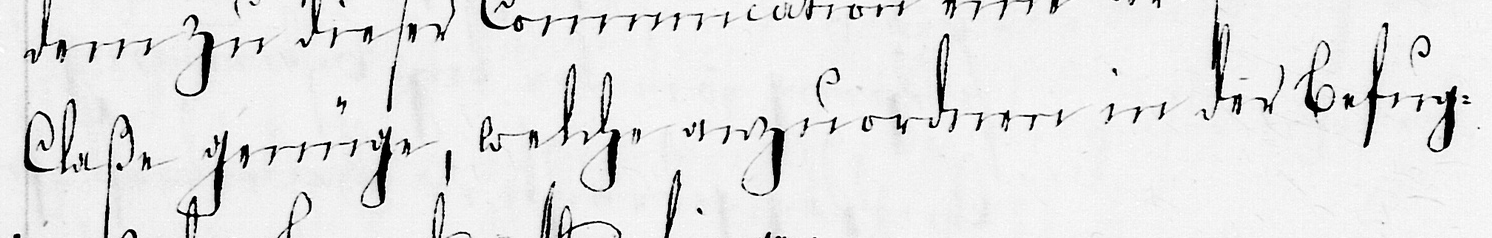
Claße genüge, welche anzuordnen in der Befug¬
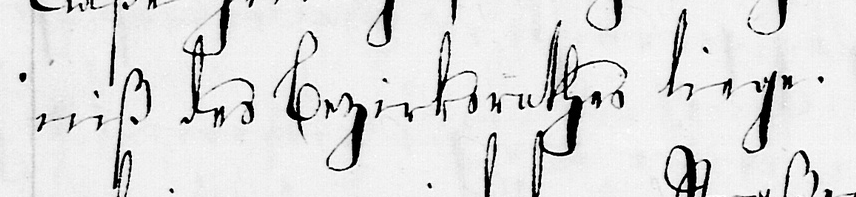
niß des Bezirksrathes liege.
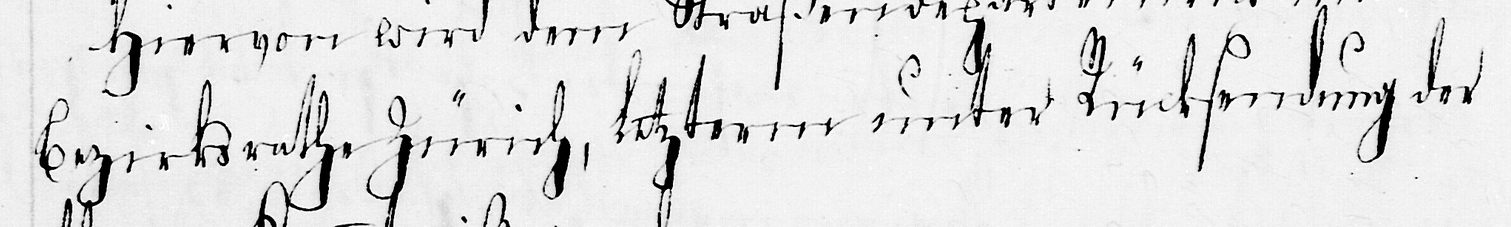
Bezirksrathe Zürich, Letzterm unter Rücksendung der
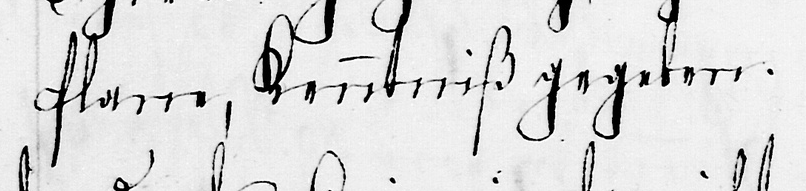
Plane, Kenntniß gegeben.
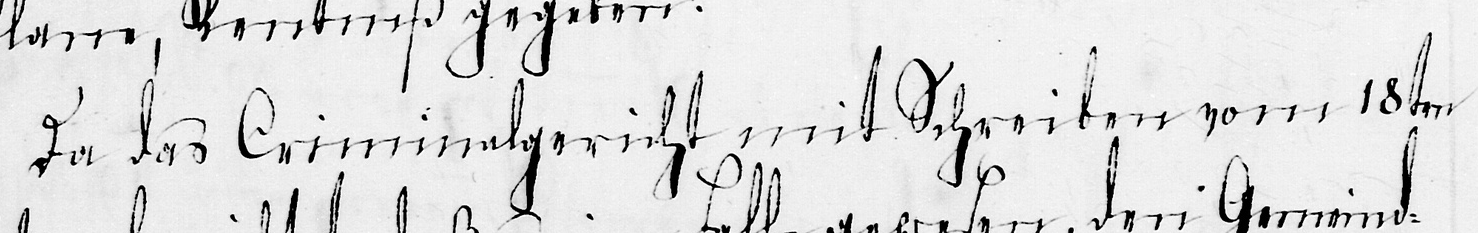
Da das Criminalgericht mit Schreiben vom 18ten
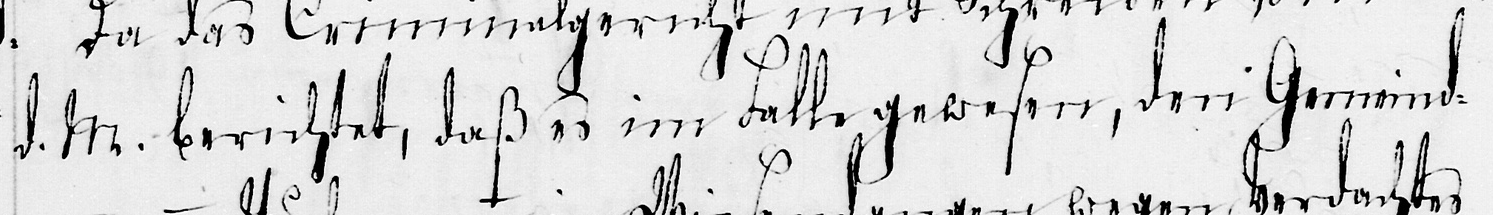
d. M. berichtet, daß es im Falle gewesen, den Gemeind¬
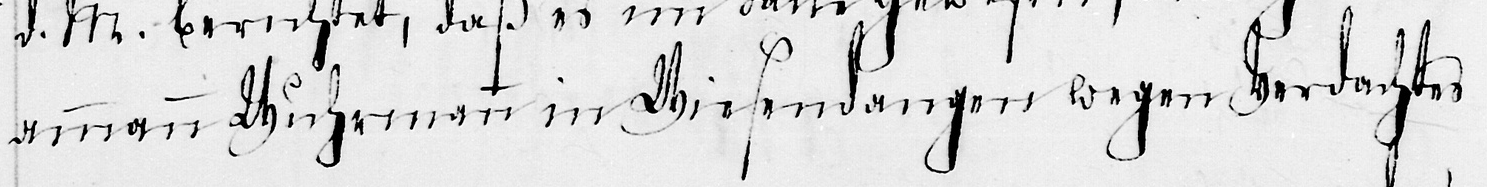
ammann Wuhrmann in Wiesendangen wegen Verdachtes
